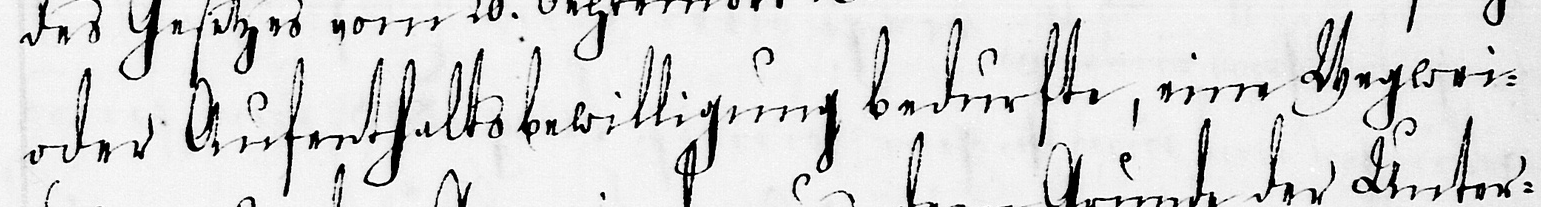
oder Aufenthaltsbewilligung bedurfte, eine Wegwei¬
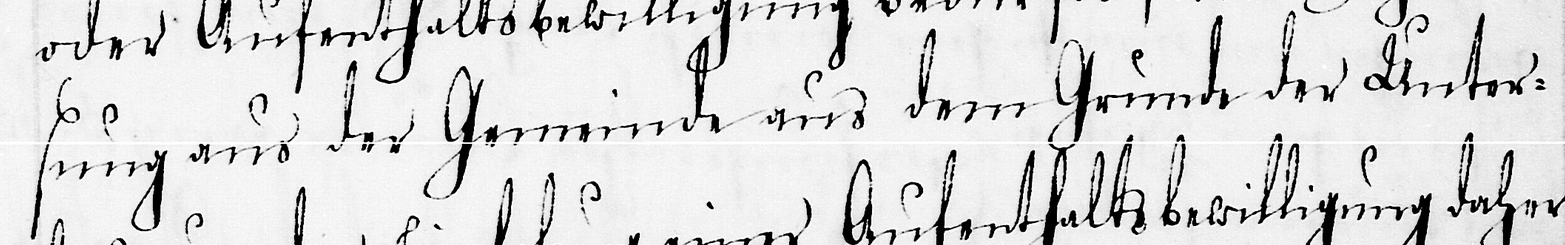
sung aus der Gemeinde aus dem Grunde der Unter¬
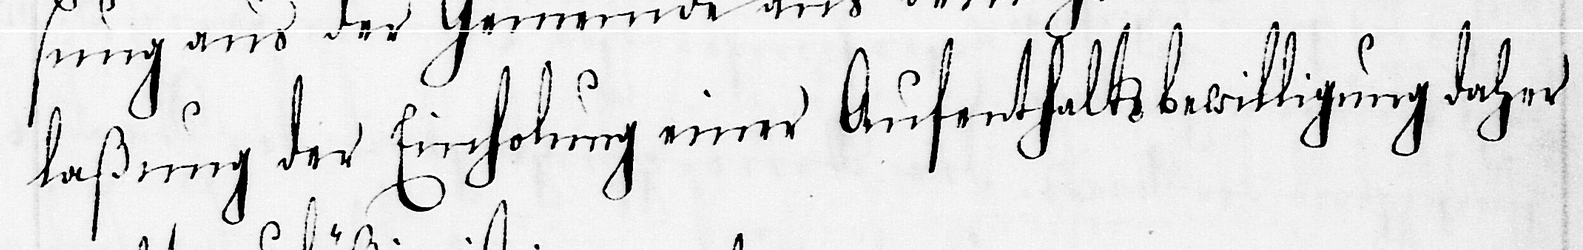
laßung der Einholung einer Aufenthaltsbewilligung daher
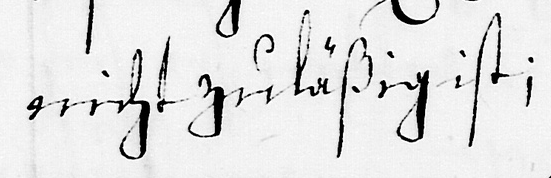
nicht zuläßig ist;
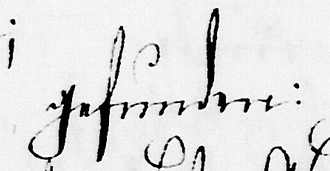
gefunden:
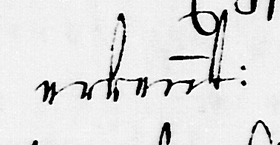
erkennt:
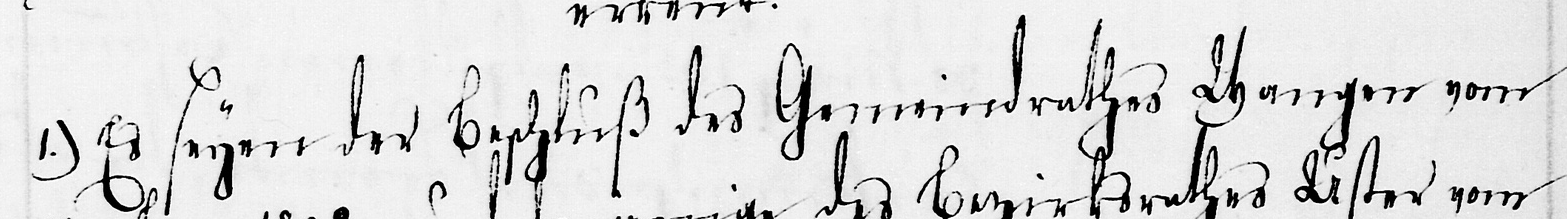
1.) Es seyen der Beschluß des Gemeindrathes Wangen vom
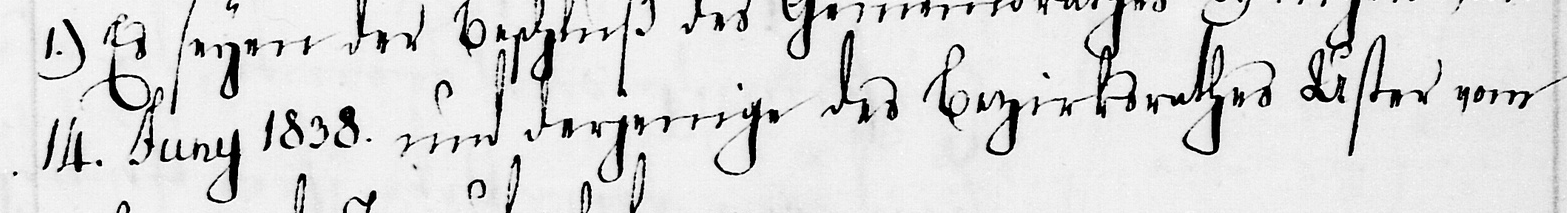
14. Juny 1838. und derjenige des Bezirksrathes Uster vom
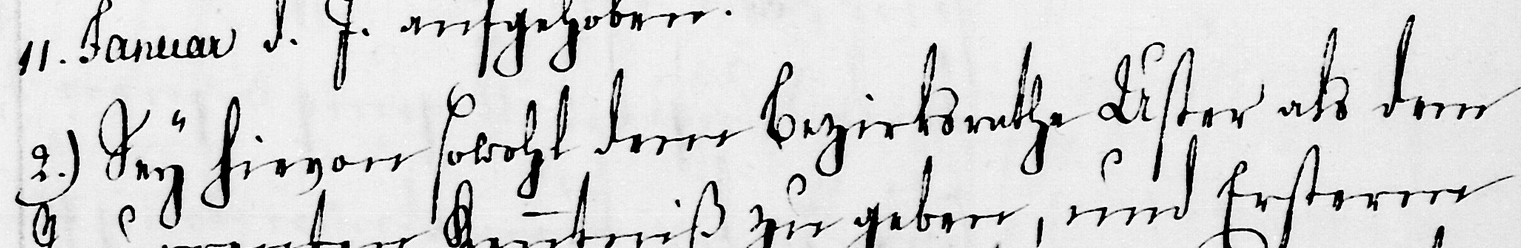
2.) Sey hievon sowohl dem Bezirksrathe Uster als dem
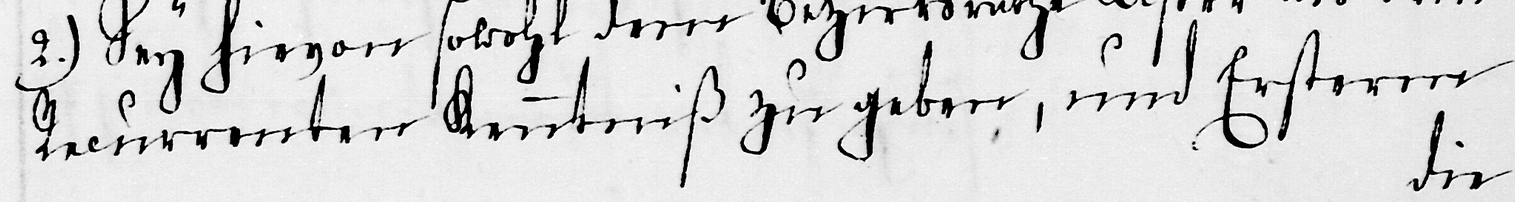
Recurrenten Kenntniß zu geben, und Ersterm
